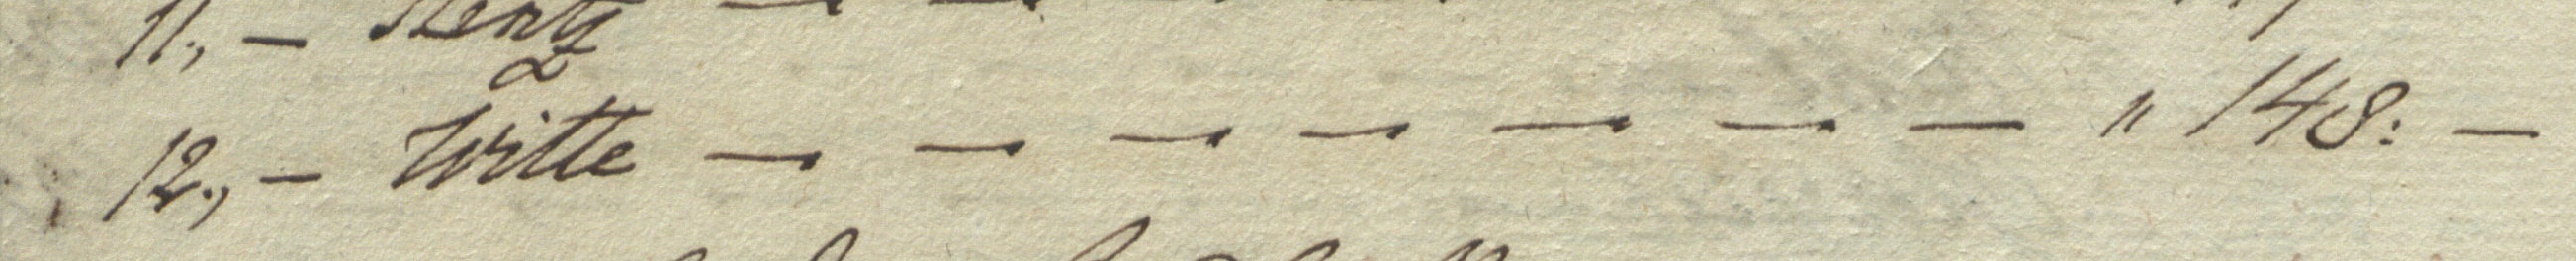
12., Witte 148:
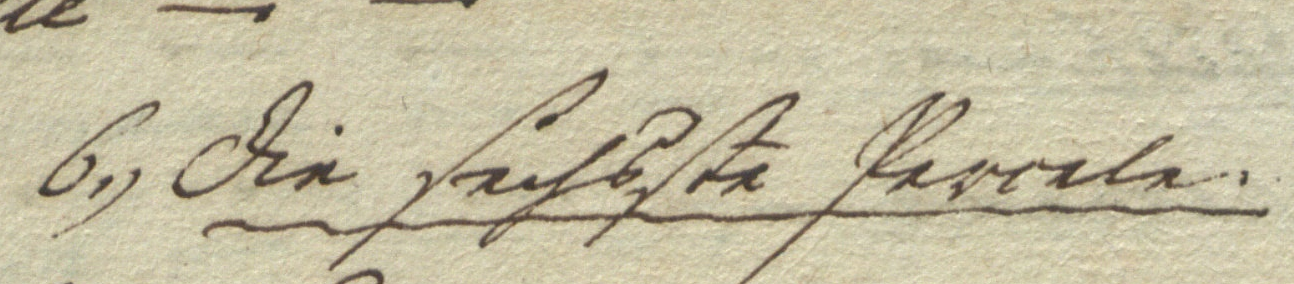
6., Die sechste Percele
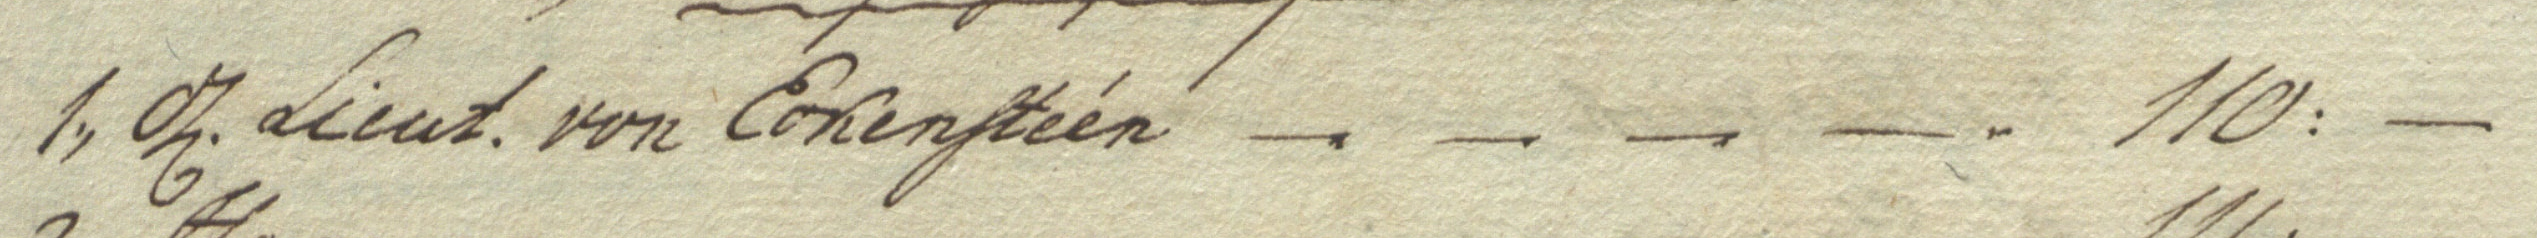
1., dh. Lieut. von Eckensteén 110:
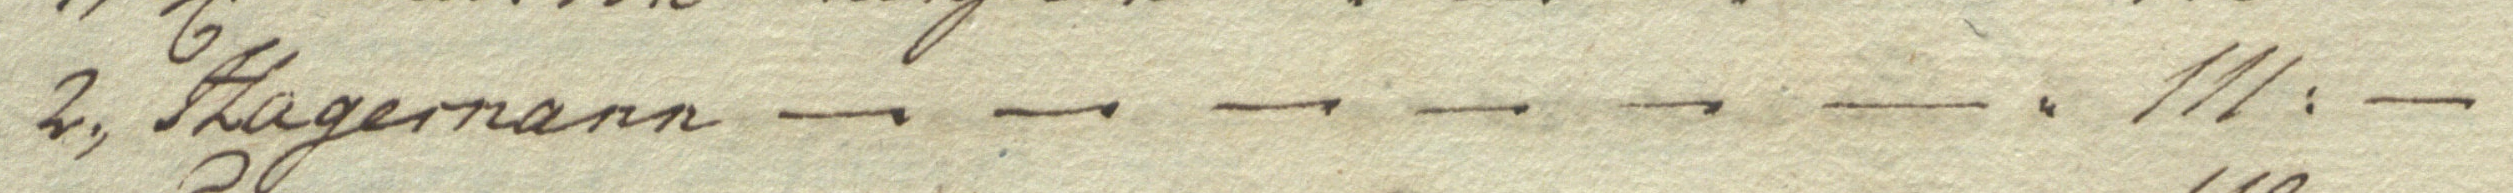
2., Hagemann 111:
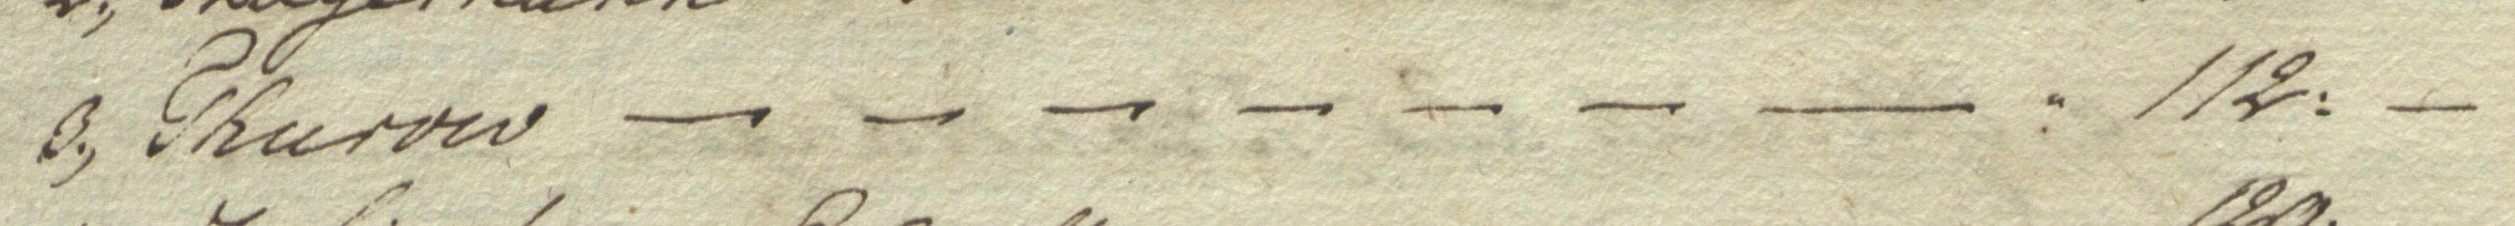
3., Thurow 112:
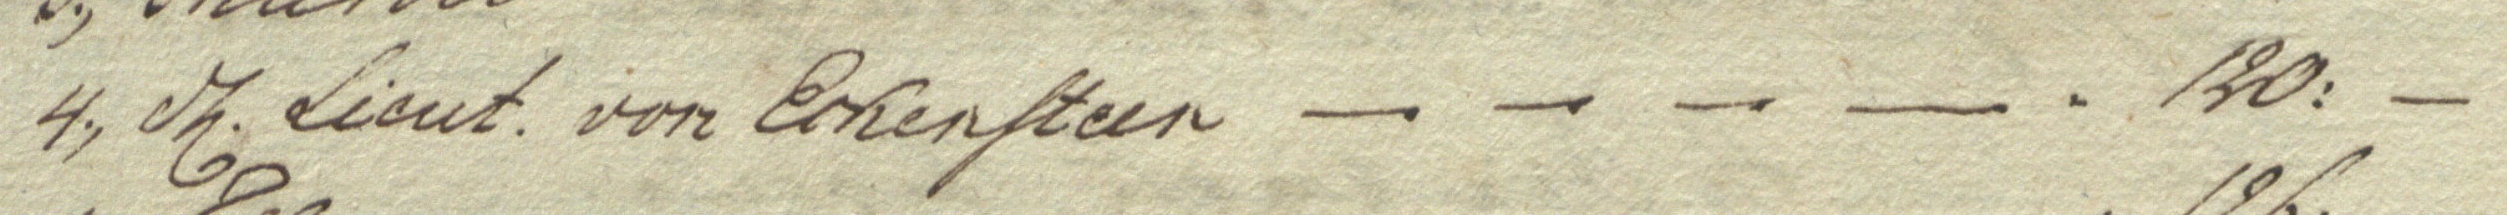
4., dh. Licent. von Eckensteén 120:
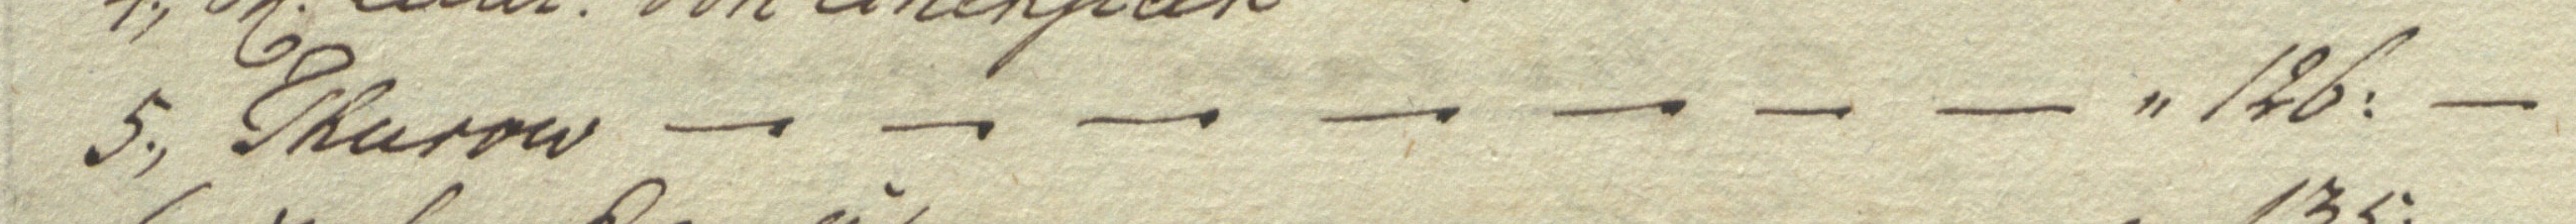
5., Thurow 126:
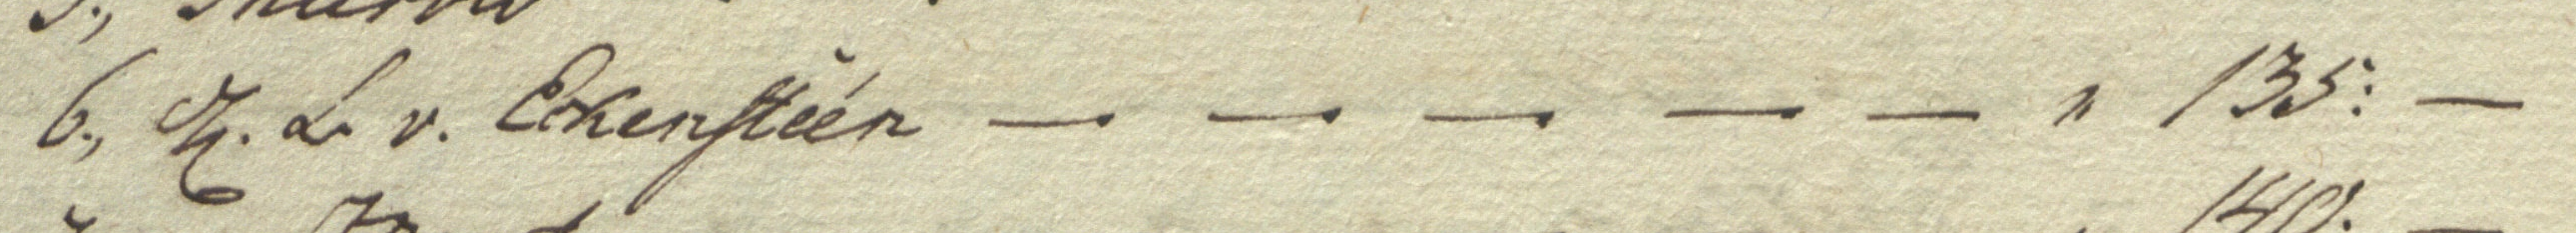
6., dh. L. v. Eckensteén 135:
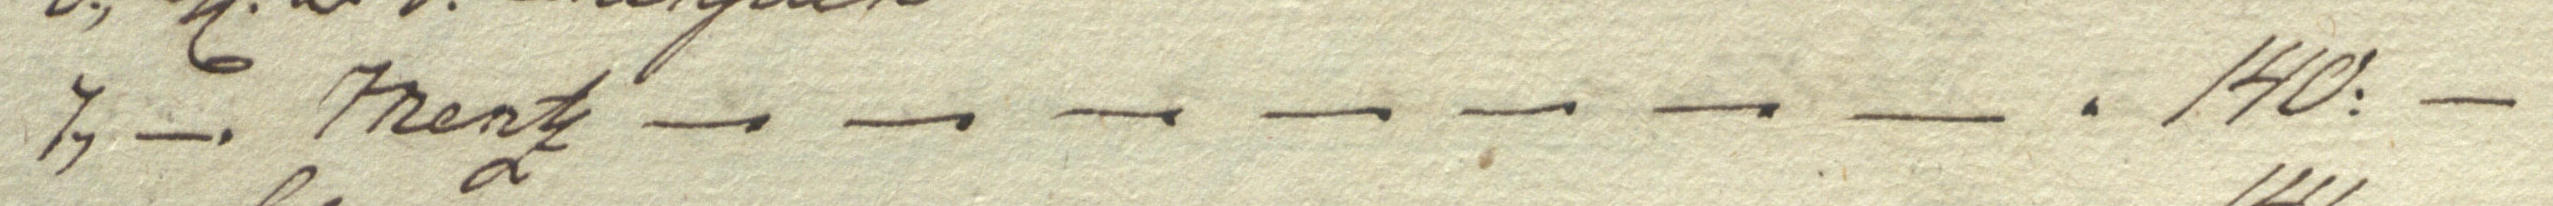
7., Mentz 140:
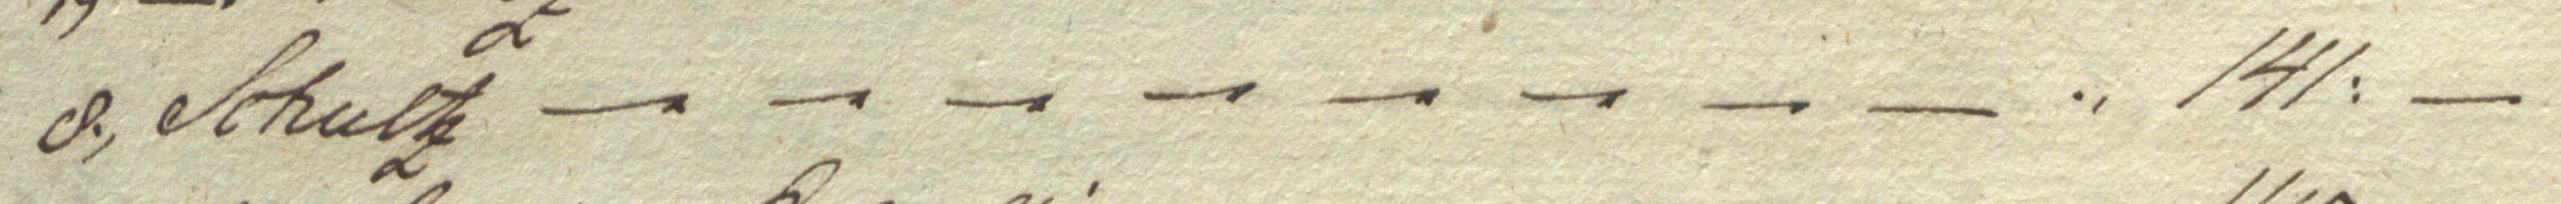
8., Schultz 141:
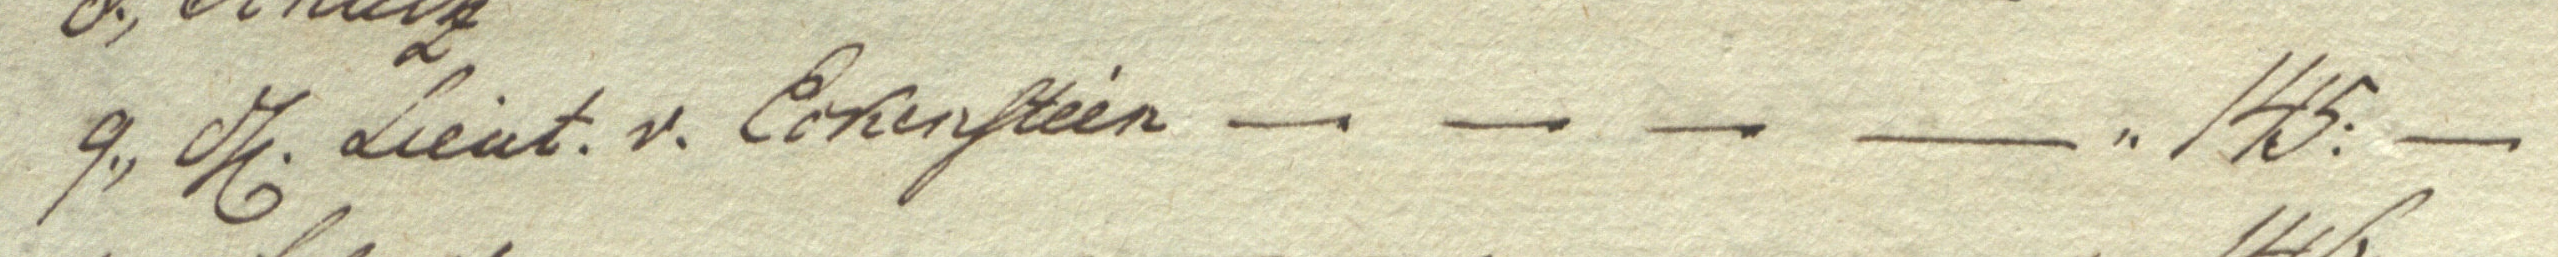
9., dh. Lieut. v. Eckensteén 145:
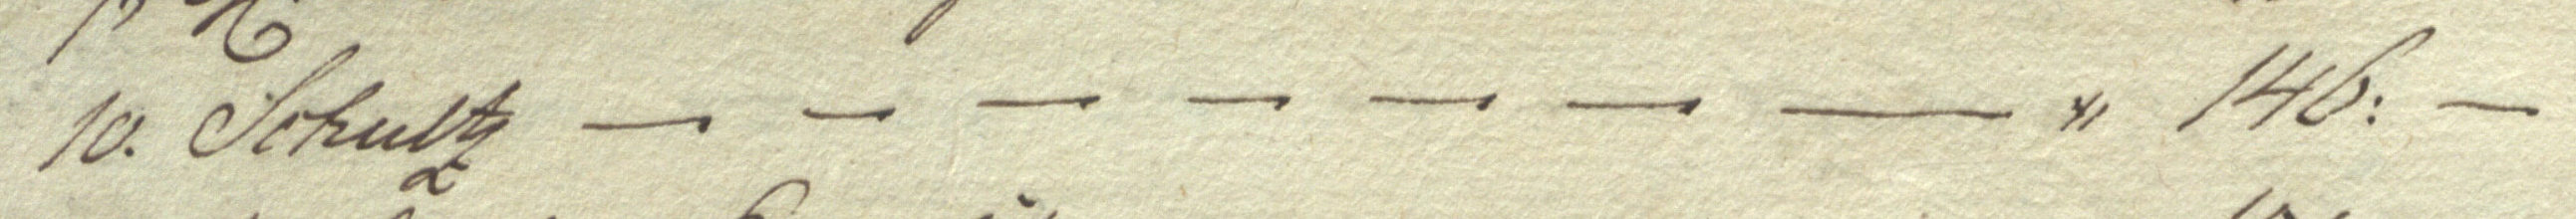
10. Schultz 146:
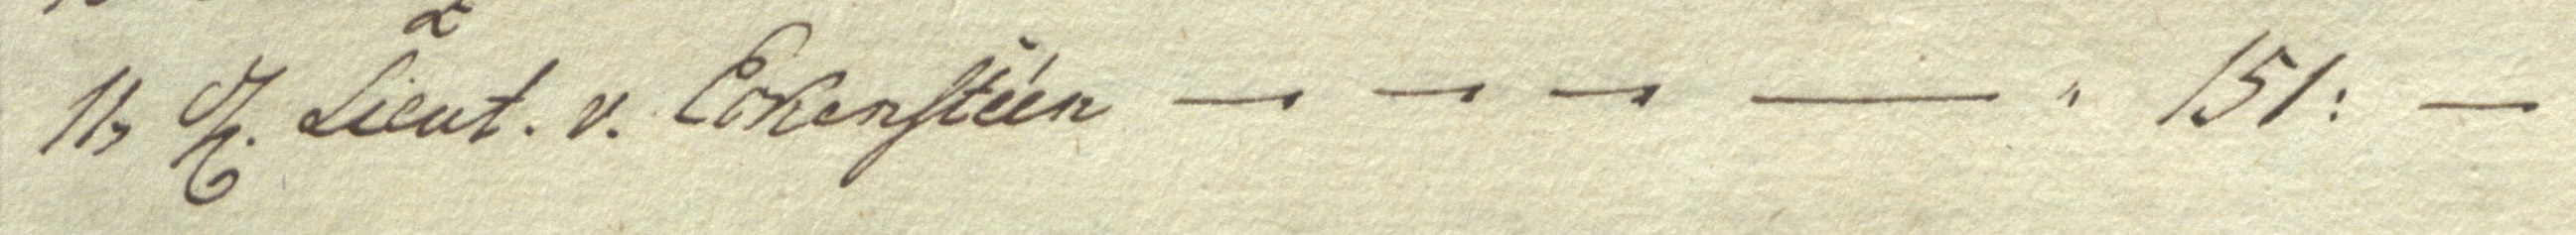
11., dh. Lieut. v. Eckensteén 151:
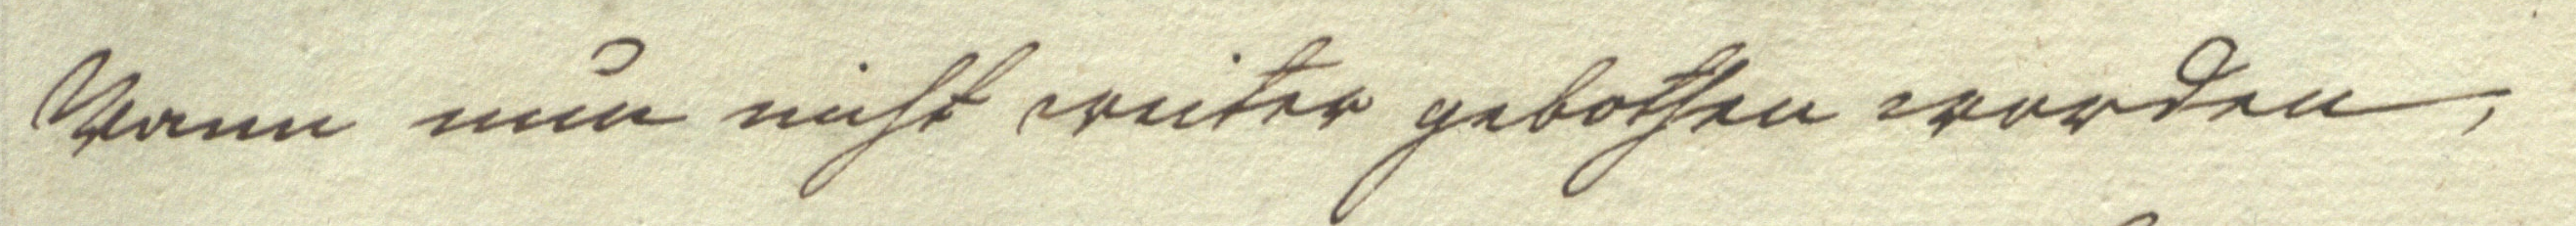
Wann nun nicht weiter gebothen worden,
